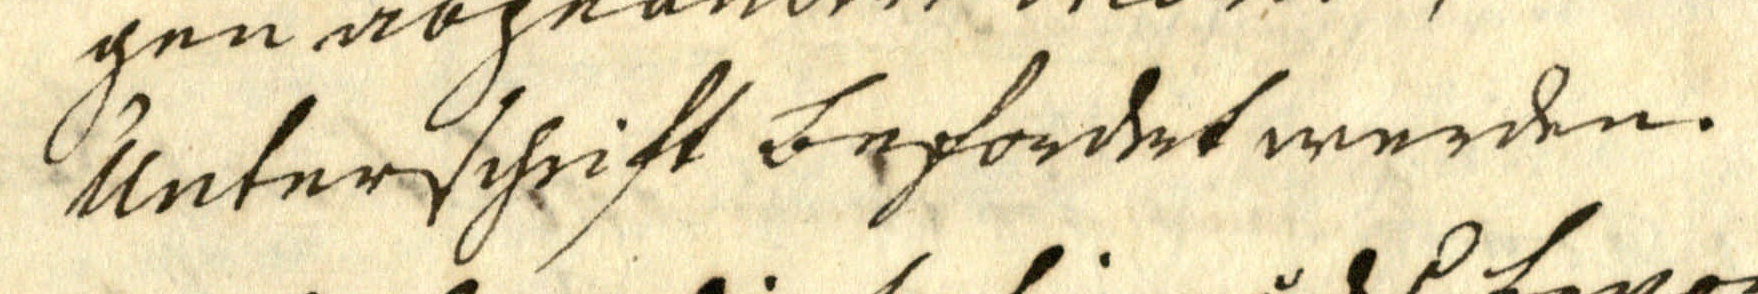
Unterschrift befordert werden.
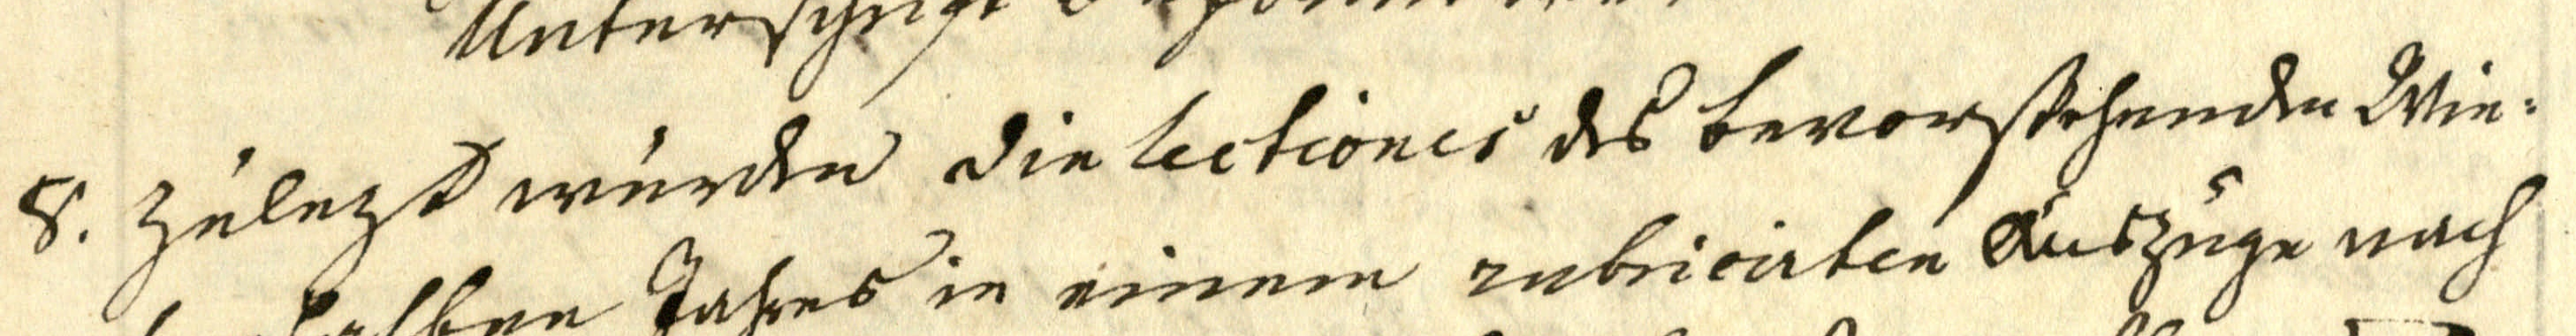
8. Zulezt würden die Lectionen des bevorstehenden Win¬
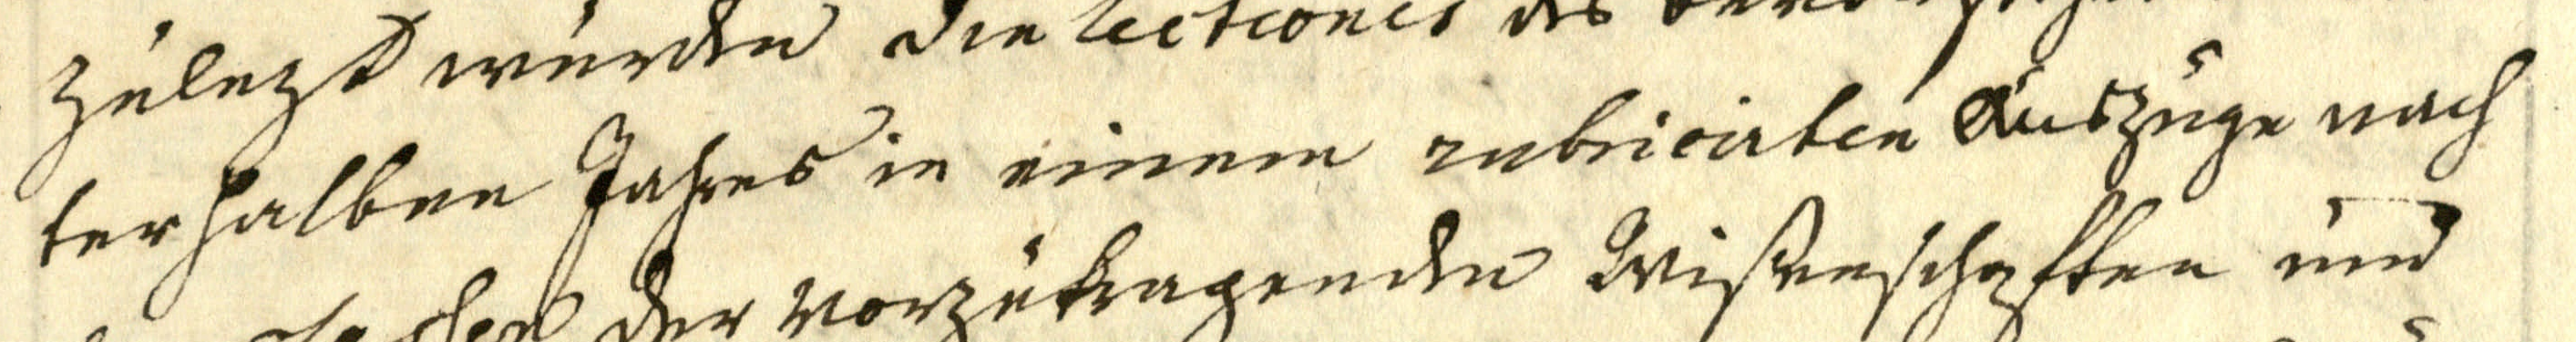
ter halben Jahres in einem rubricirten Auszuge nach
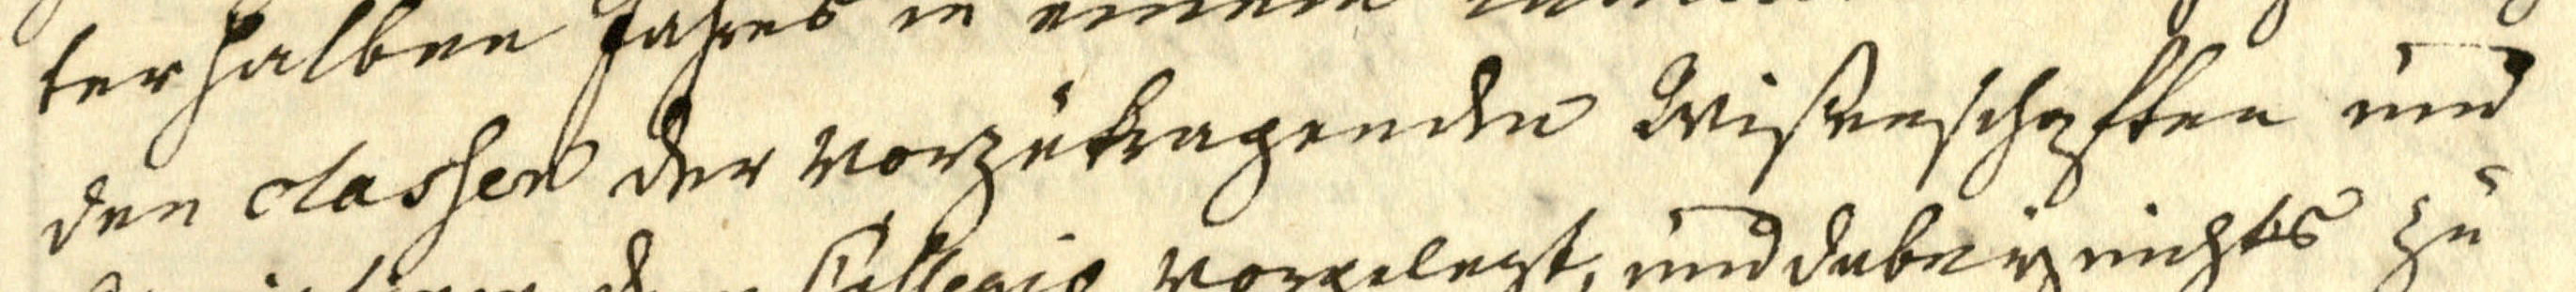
den classen der vorzutragenderm Wissenschaften und
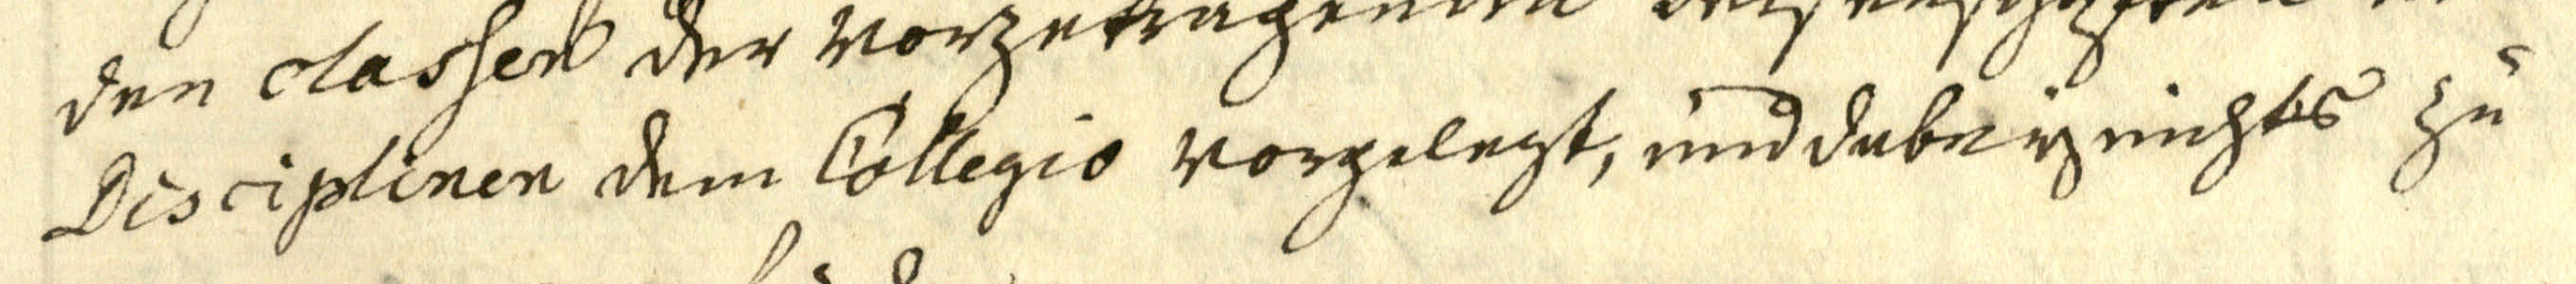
Disciplinen dem Collegio vorgelegt, und dabeÿ nichts zu
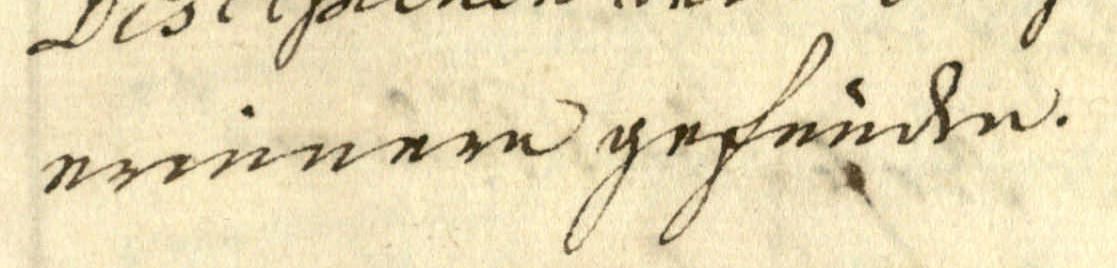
erinnern gefunden.
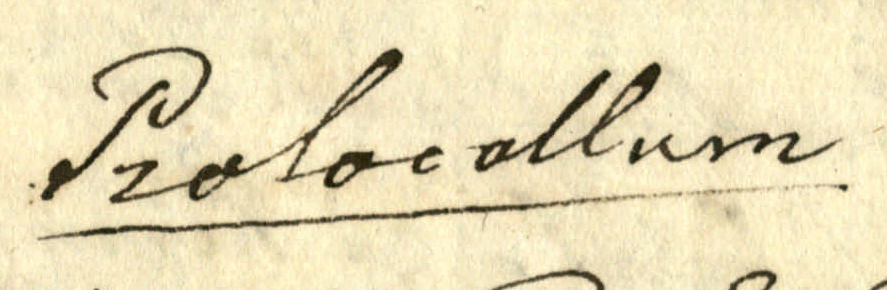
Protocollum
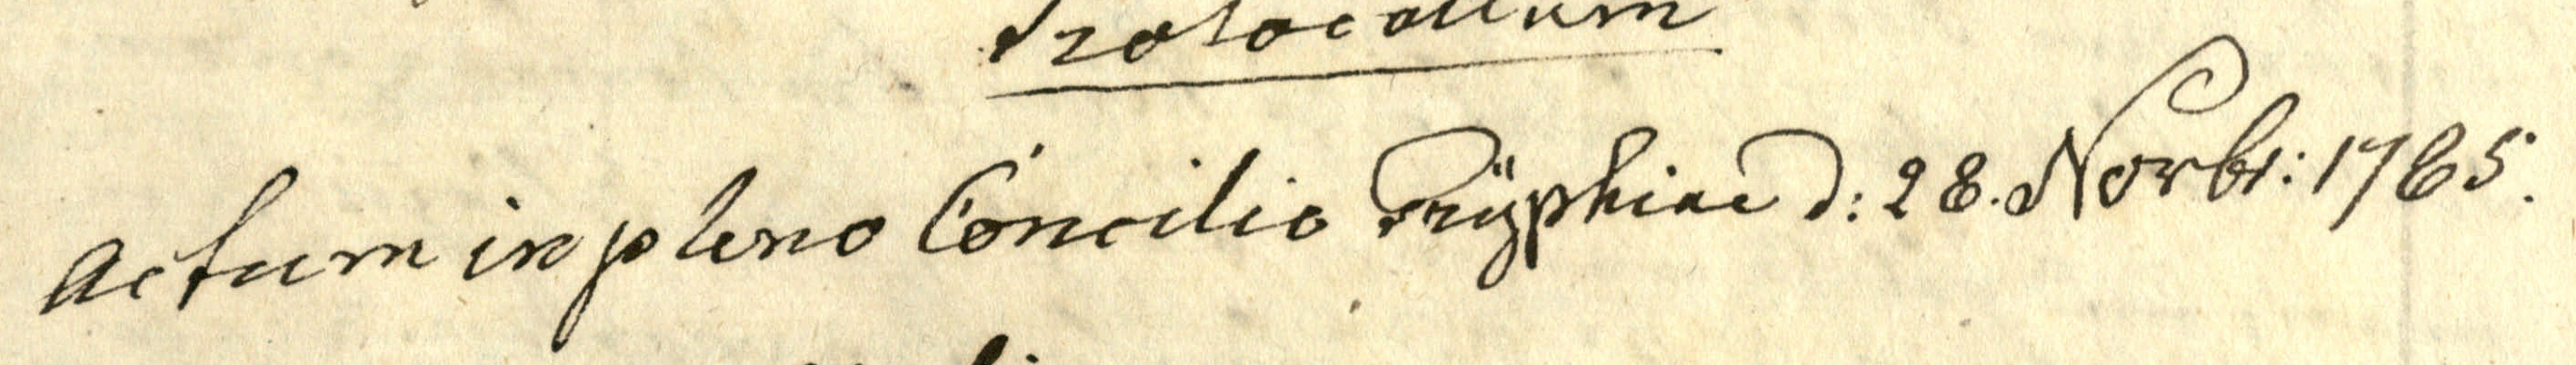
Actum in pleno Concilio Grÿphiae d. 28. Novbr. 1785.
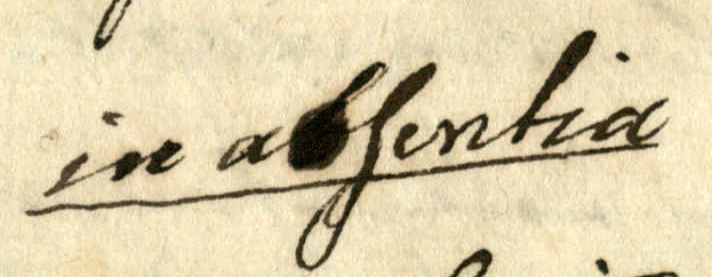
in absentia
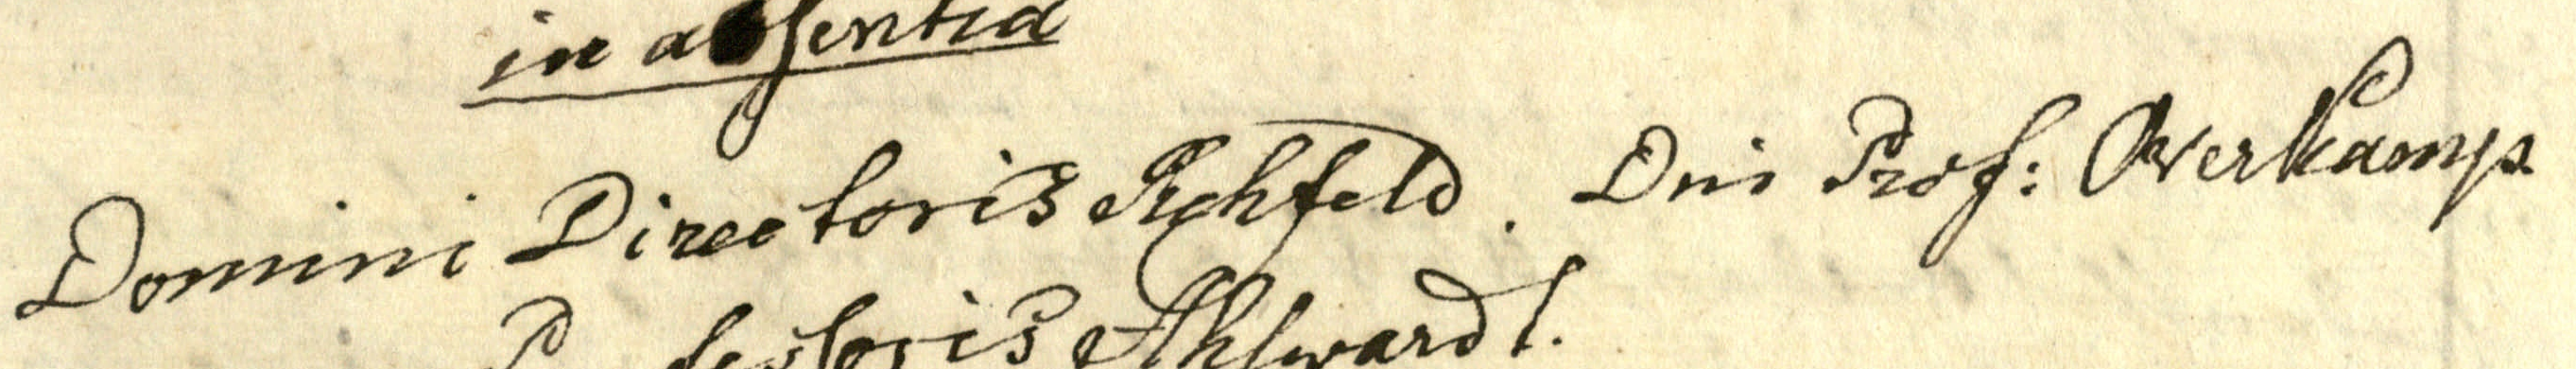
Domini Directoris Rehfeld. Dni Prof. Overkamp
